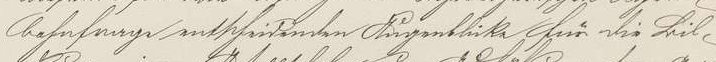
bahnfrage entscheidenden Augenblicke für die Bil-
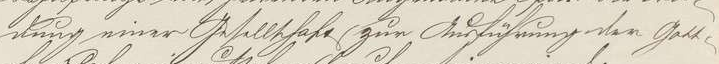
dung einer Gesellschaft zur Ausführung der Gott-
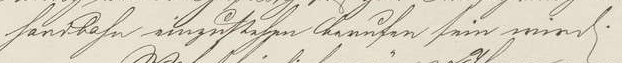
hardbahn einzustehen berufen sein wird.
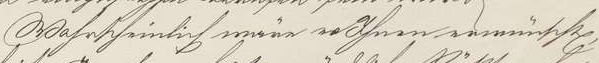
Wahrscheinlich wäre es Ihnen erwünscht,
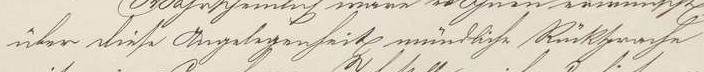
über diese Angelegenheit mündliche Rücksprache
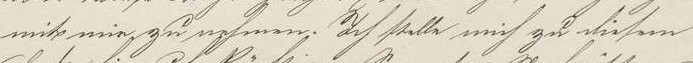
mit mir zu nehmen. Ich stelle mich zu diesem
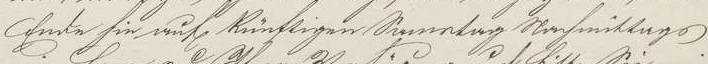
Ende hin auf künftigen Samstag Nachmittags
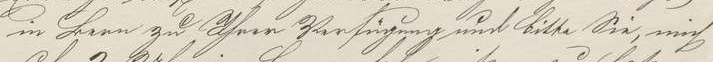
in Bern zu Ihrer Verfügung und bitte Sie, mich
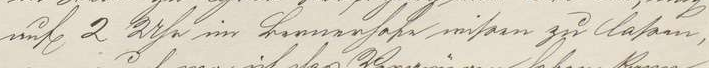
auf 2 Uhr im Bernerhofe wißen zu lassen,
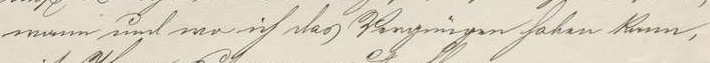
wann und wo ich das Vergnügen haben kann,
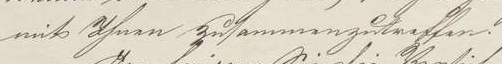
mit Ihnen zusammenzutreffen.
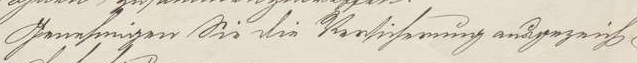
Genehmigen Sie die Versicherung ausgezeich-
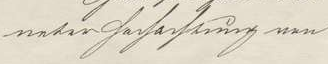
neter Hochachtung von
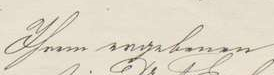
Ihrem ergebenen
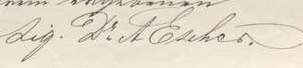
sig. Dr A Escher
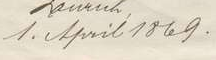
1. April 1869.
